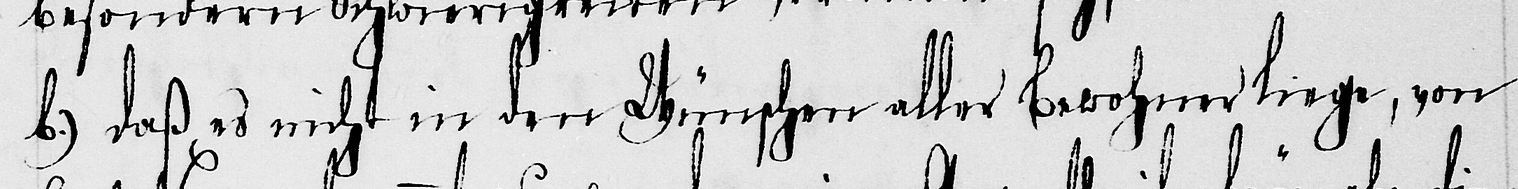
b.) daß es nicht in den Wünschen aller Bewohner liege, von
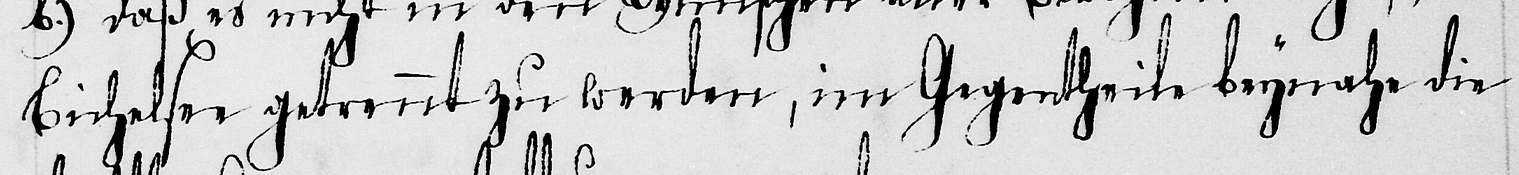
Bichelsee getrennt zu werden, im Gegentheile beynahe die
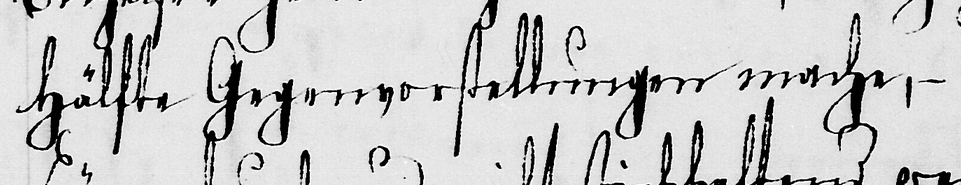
Hälfte Gegenvorstellungen mache,
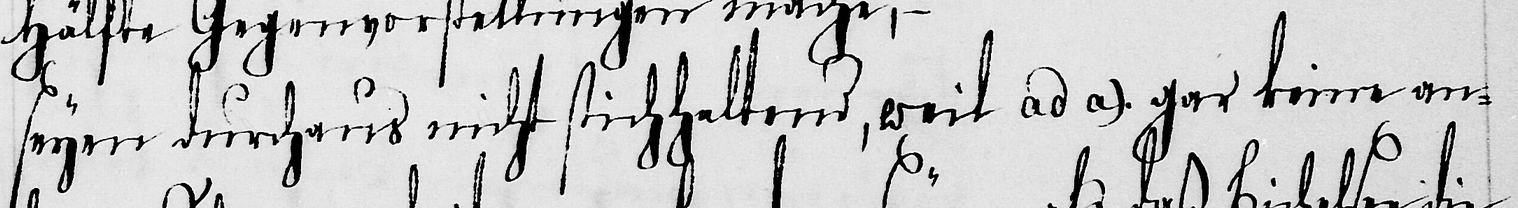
seyen durchaus nicht stichhaltend, weil ad a.) gar keine an¬
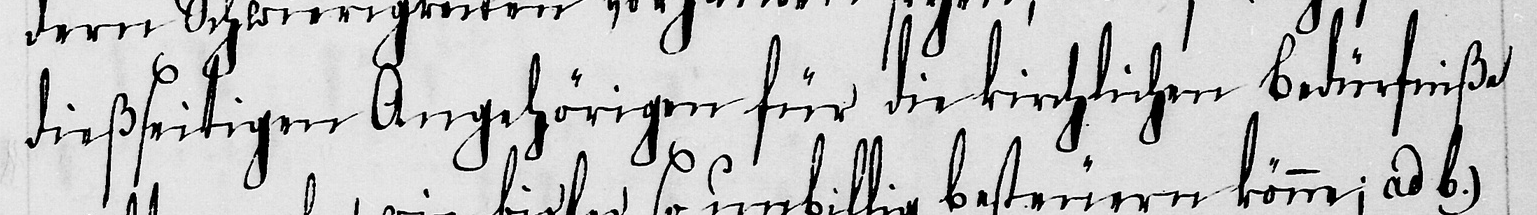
dießseitigen Angehörigen für die kirchlichen Bedürfniße
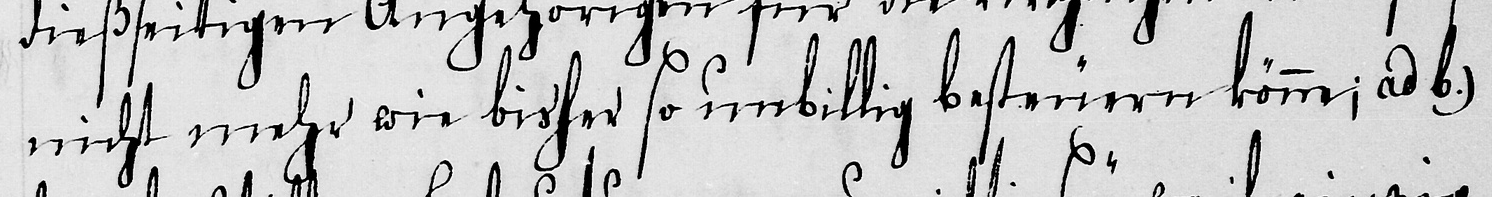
nicht mehr wie bisher so unbillig besteuern könne; ad b.)
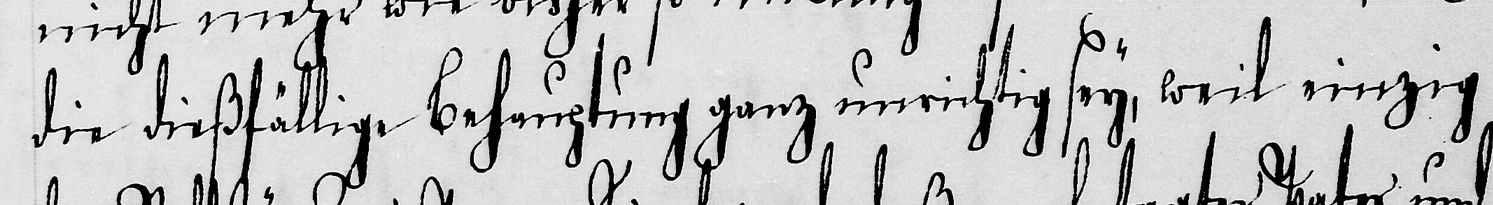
die dießfällige Behauptung ganz unrichtig sey, weil einzig
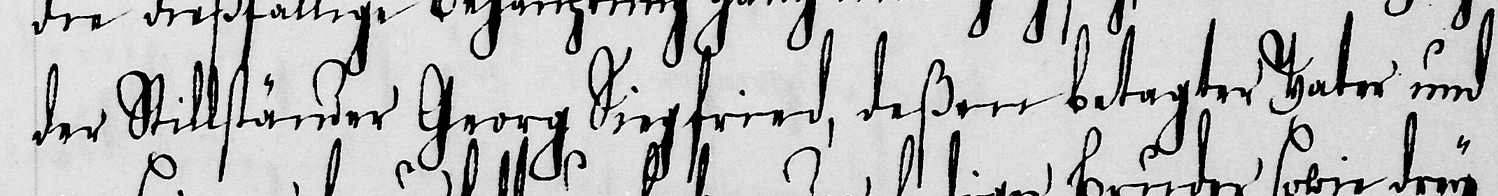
der Stillständer Georg Siegfried, deßen betagter Vater und
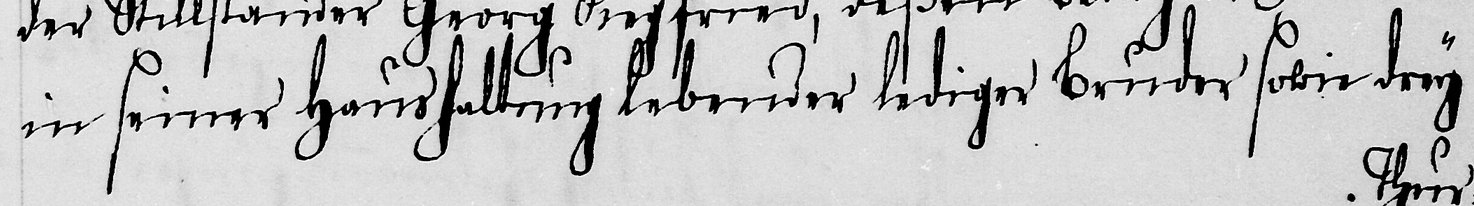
in seiner Haushaltung lebender lediger Bruder sowie drey
